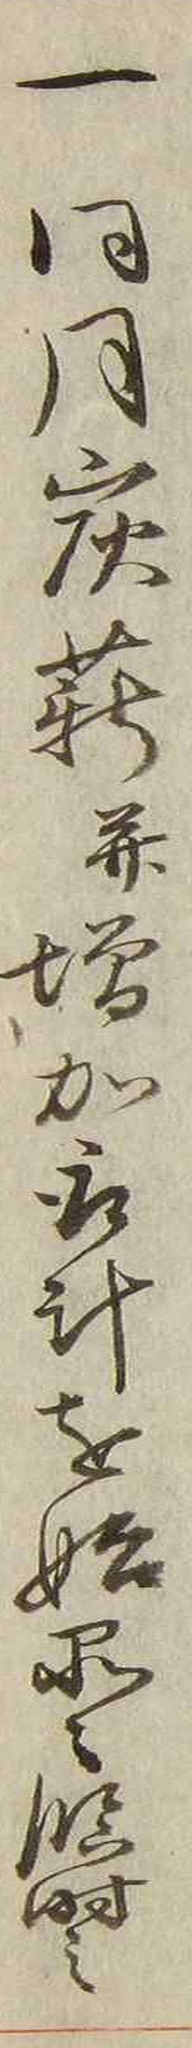一同月炭薪并増加取計を始品々臨時之

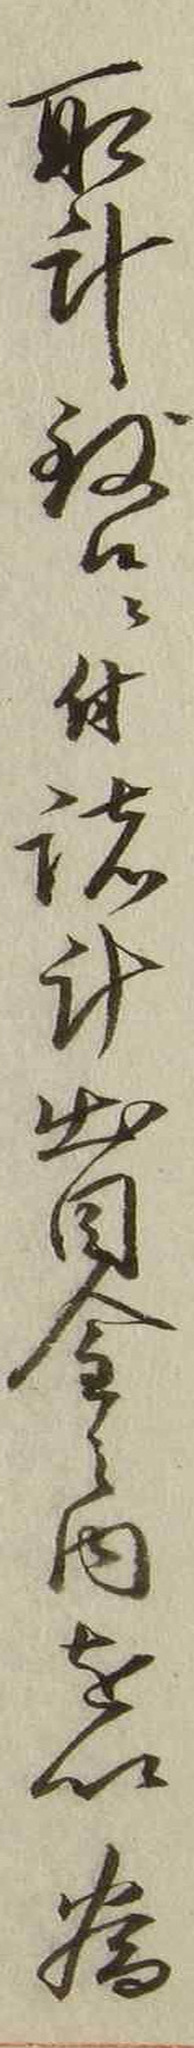取計致候ニ付諸計出目金之内を以為
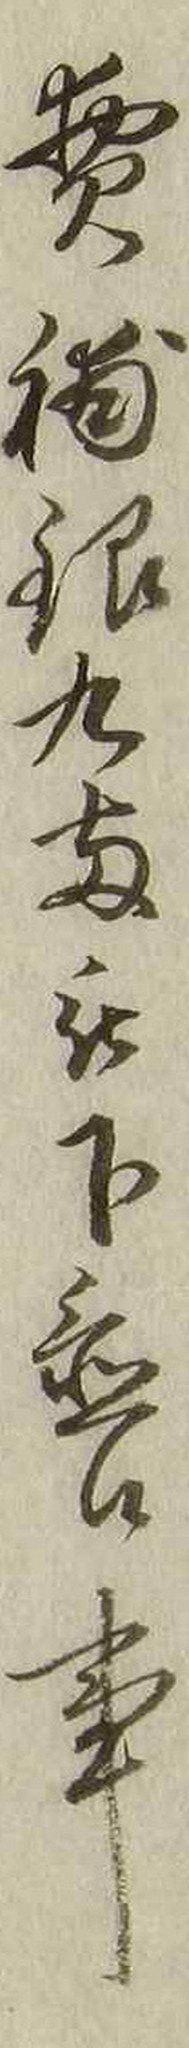費補銀九両被下置候事
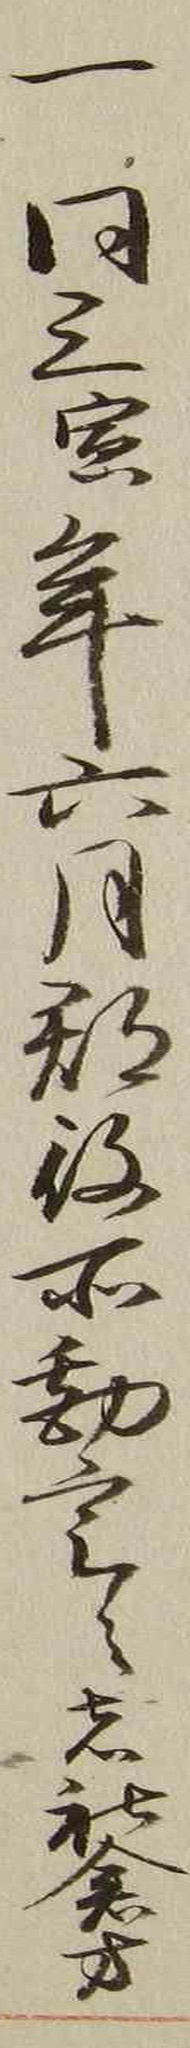一同三寅年六月郡役所勘定之者社倉方
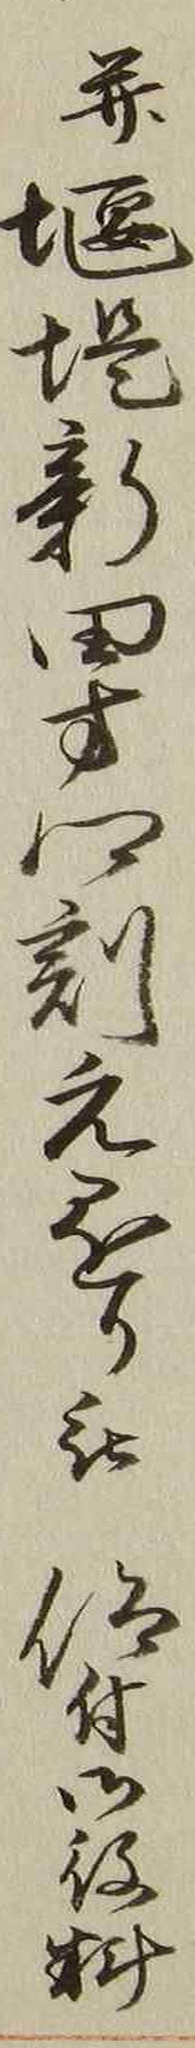并堰堤新田方郷割元懸り被仰付御役料
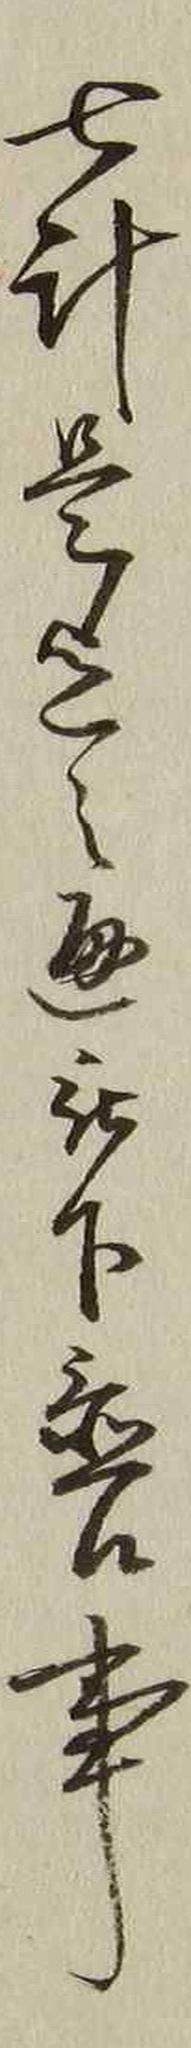七計是迄之通被下置候事
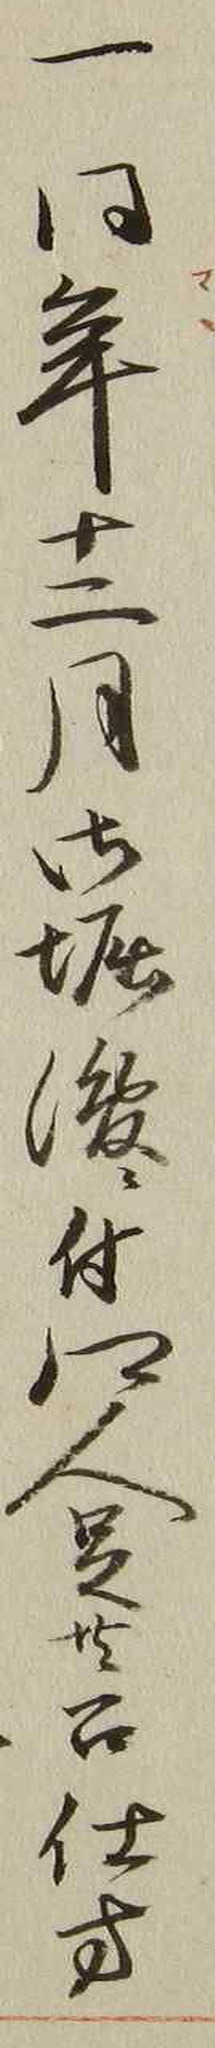一同年十二月御堀浚ニ付郷人足共召仕方
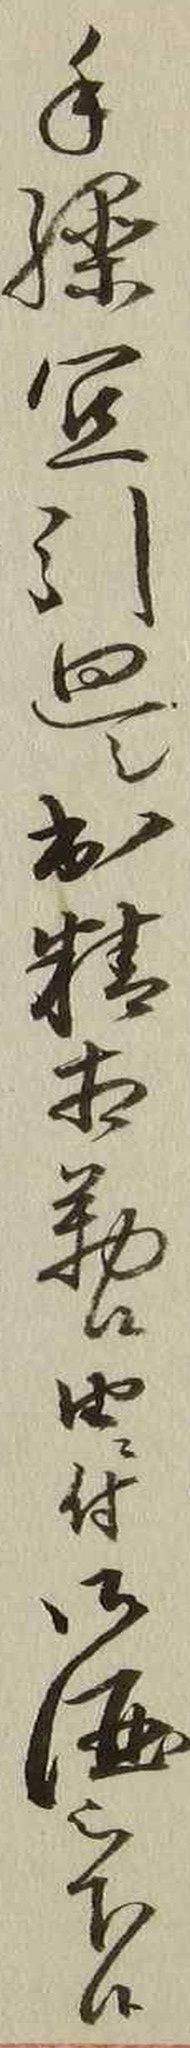手繰宜引廻シ出精相勤候由ニ付御酒被下候
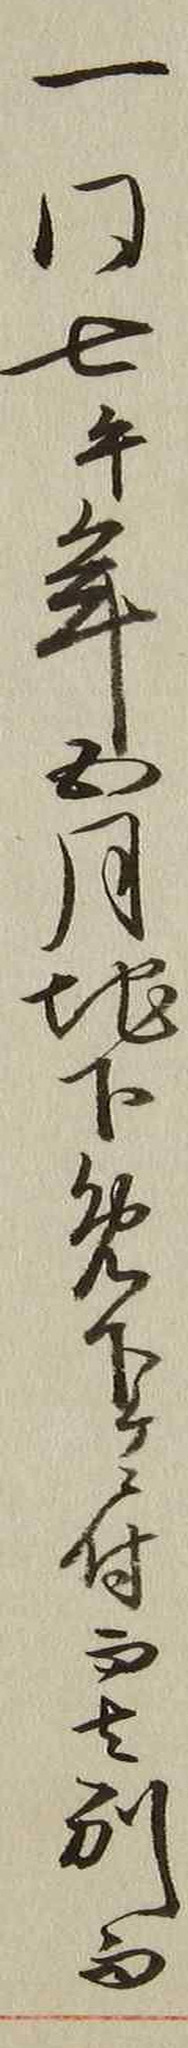一同七午年五月地下免下ケニ付而者別而
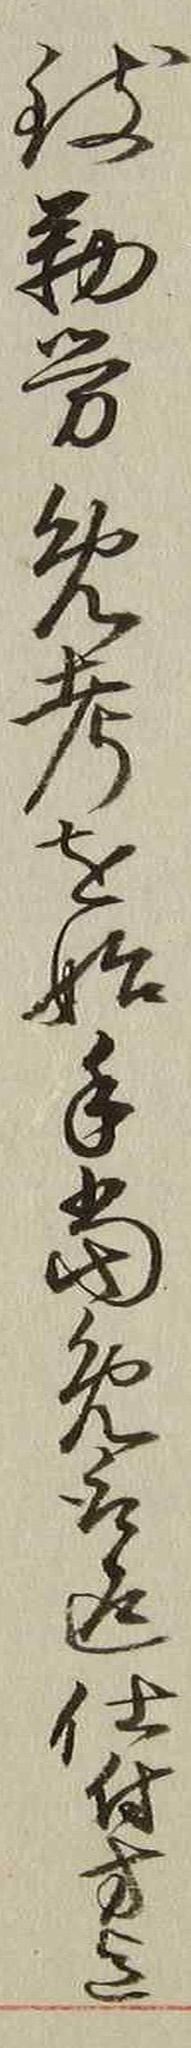致勤労免考を始手当免取返仕付方迄
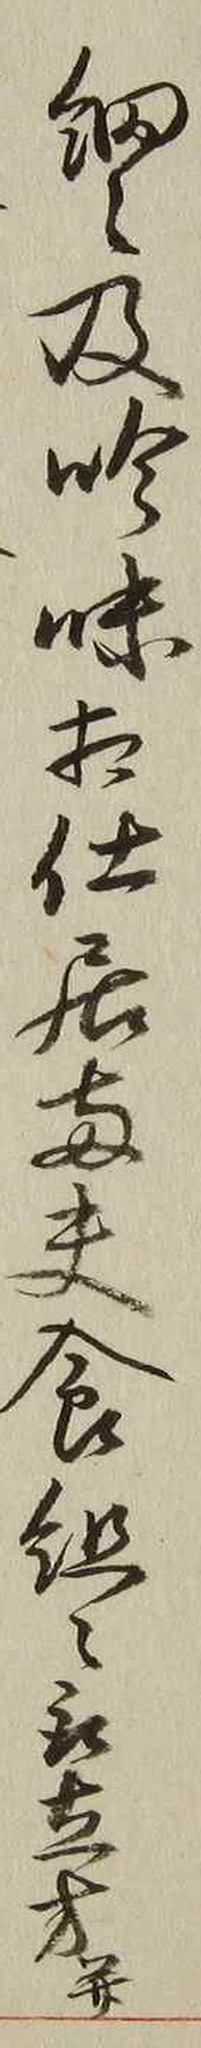細々及吟味相仕居両夫食組々取立方并
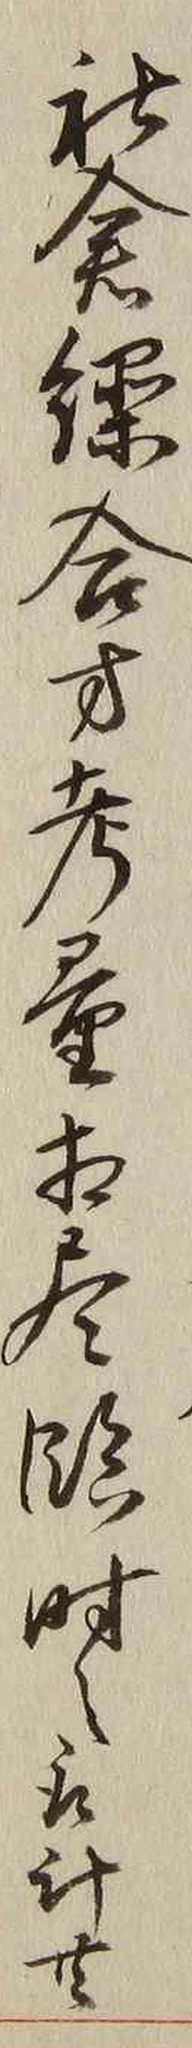社倉繰合方考量相尽臨時之取計共
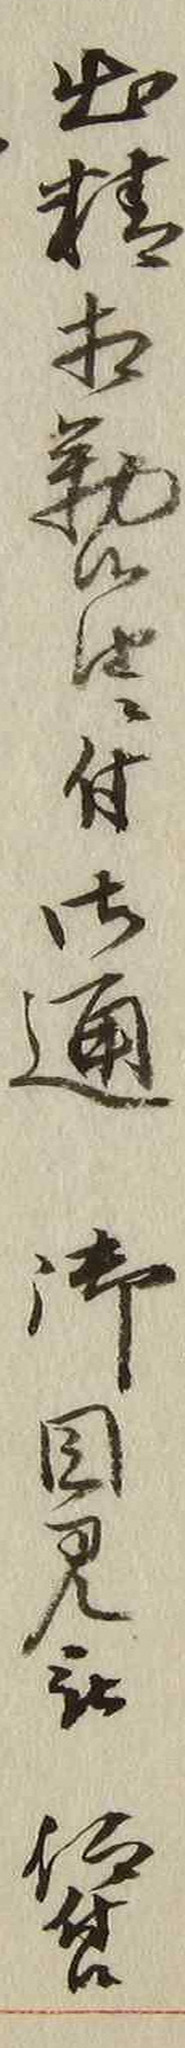出精相勤候由ニ付御通御目見被仰付候
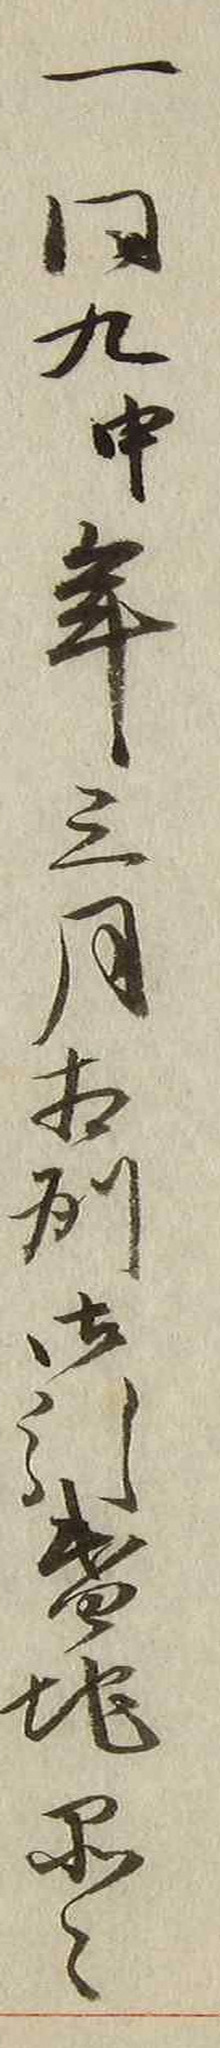一同九申年三月相州御引替地品々
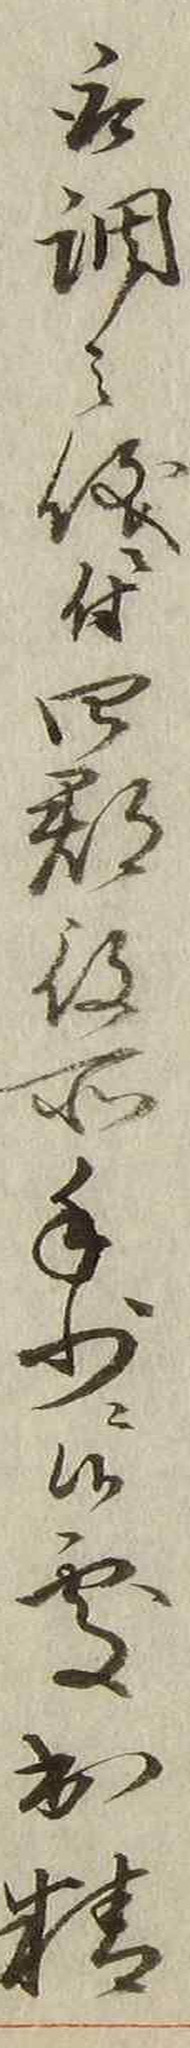取調之儀ニ付四郡役所手少ニ候処出精
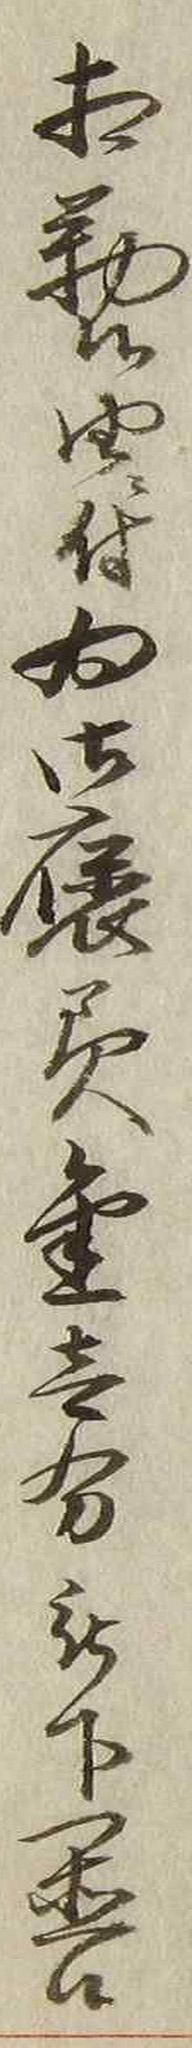相勤候由ニ付為御褒美金壱分被下置候
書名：諸士系譜　巻之102　か之部10
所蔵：会津若松市立会津図書館
